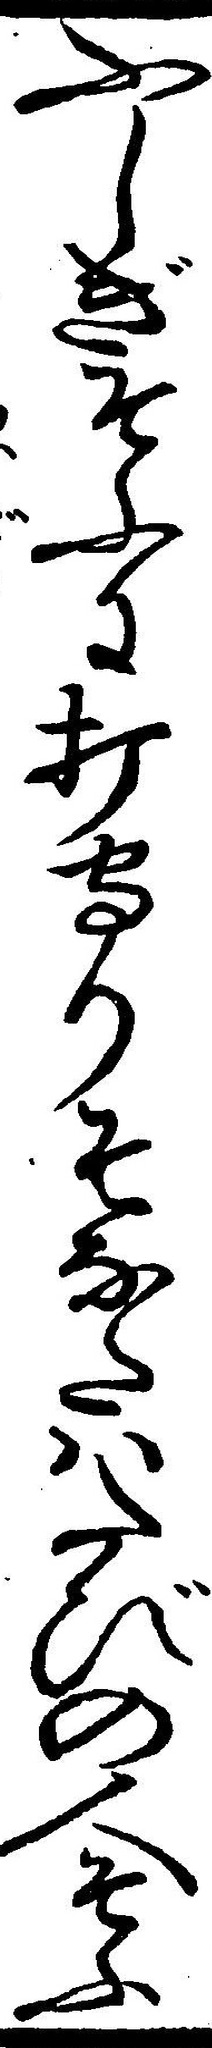ふしぎそふに打守りそなたはたびの人そふ
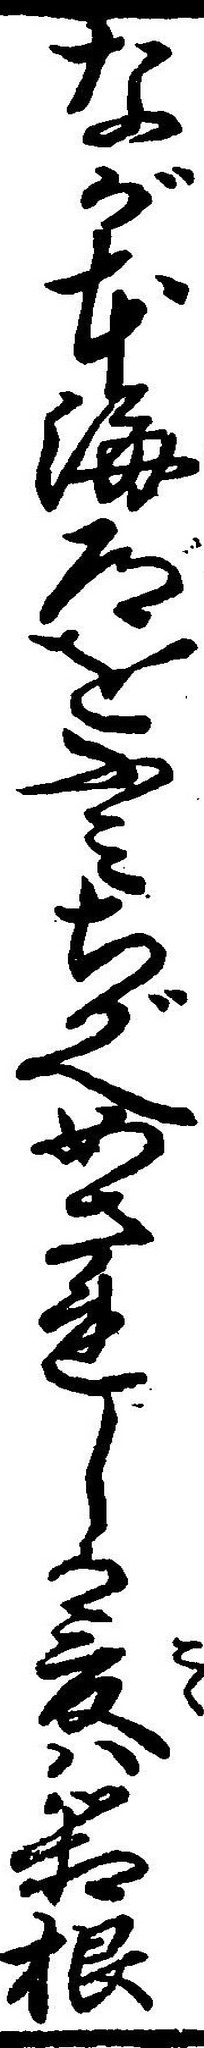なが本海道をふみちがへめされしか爰は箱根
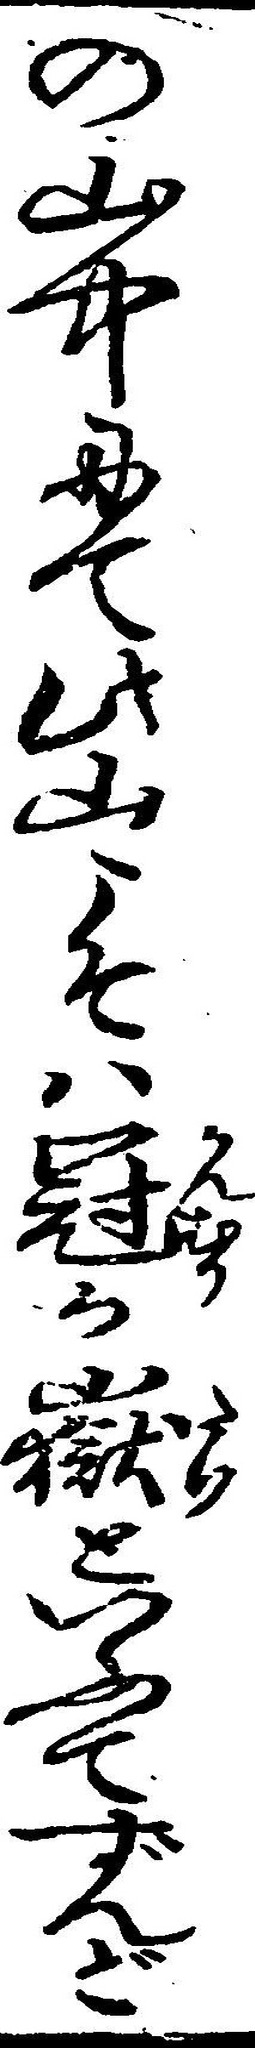の山中にて此山こそは冠か岳といふてずんど
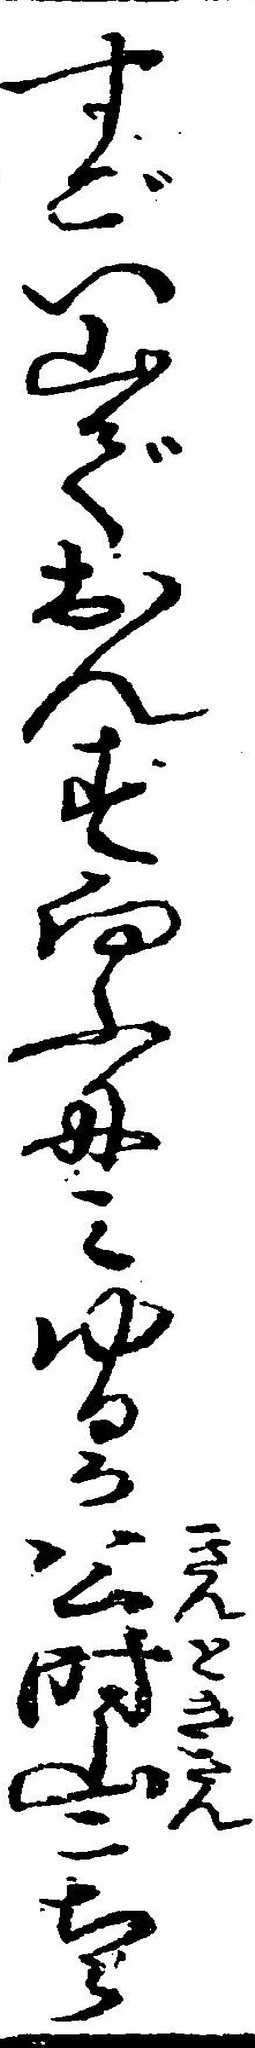すごい山でおんす向ふにみゆる公時山こちら
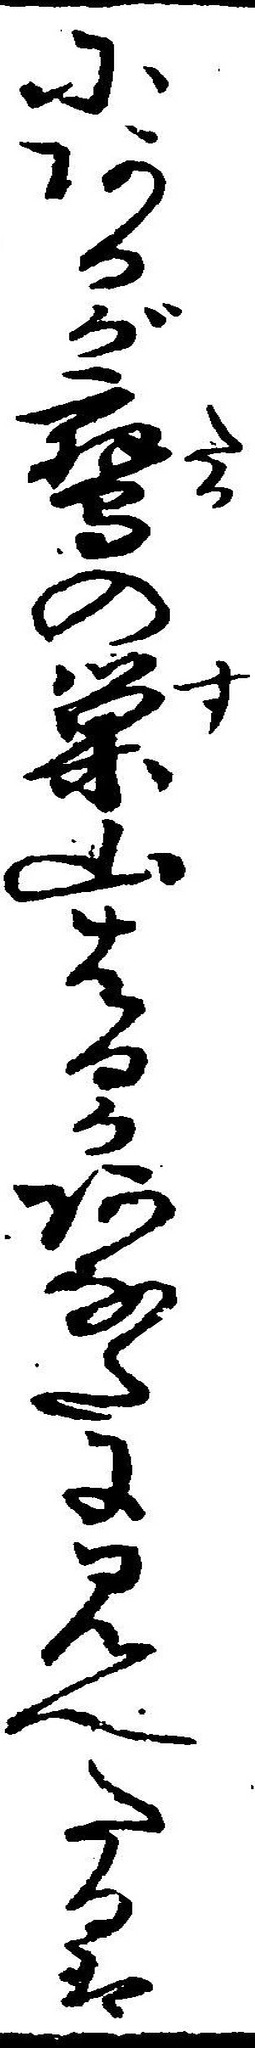にあるが鷹の巣山はるかあなたに見へたるは
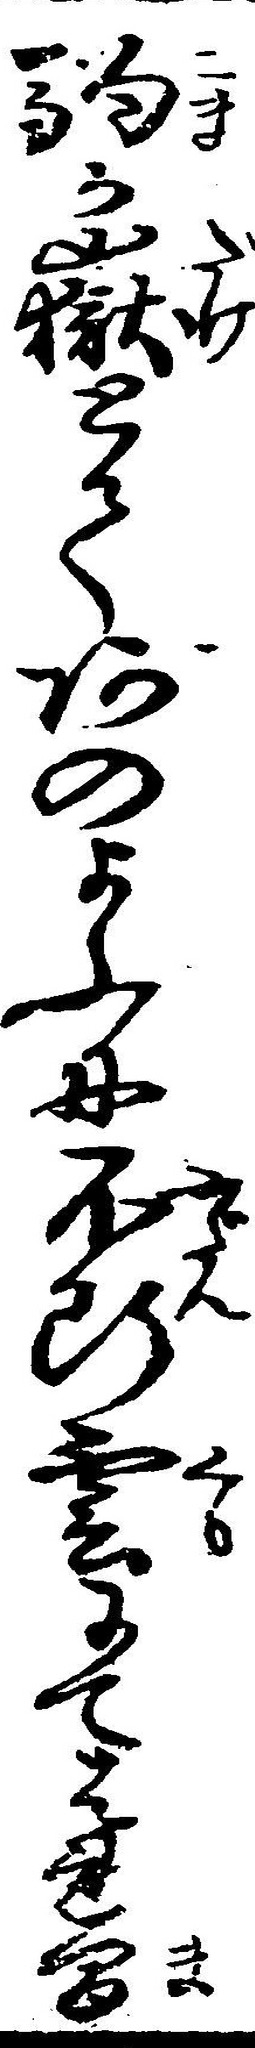駒か岳とてあのよふに不断雲にてはれ間
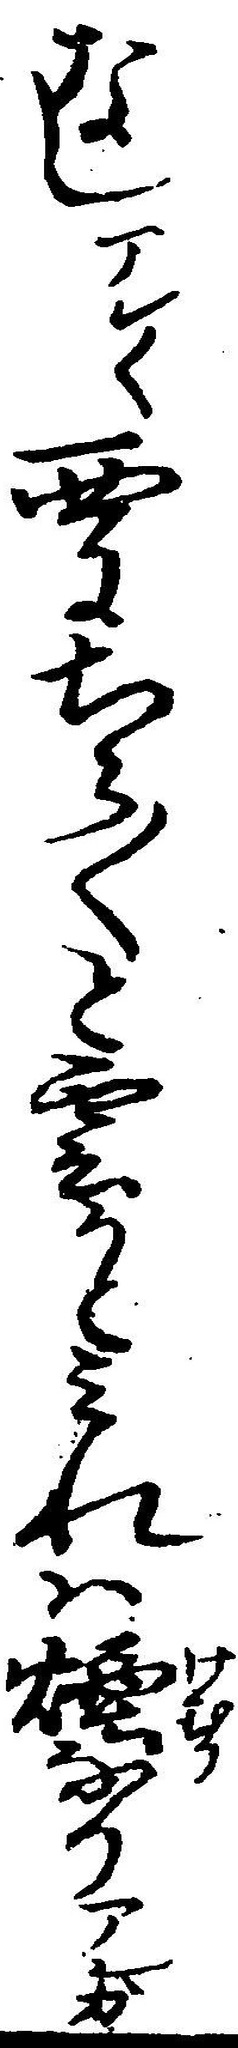なしアレ〳〵西にちら〳〵と雲かとみれは煙なり
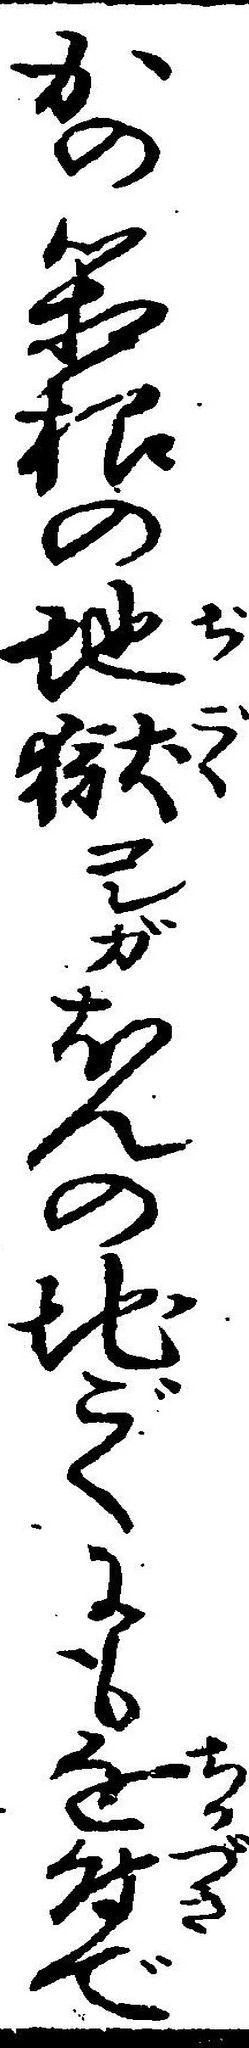かの箱根の地獄地ごくにも近付で
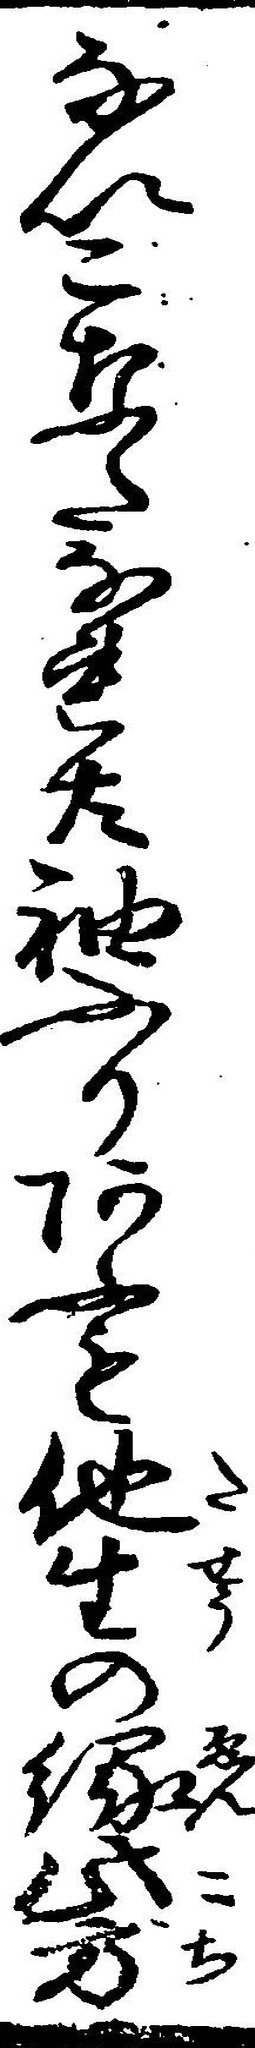ないこなたなれ共袖ふりあふも他生の縁此方

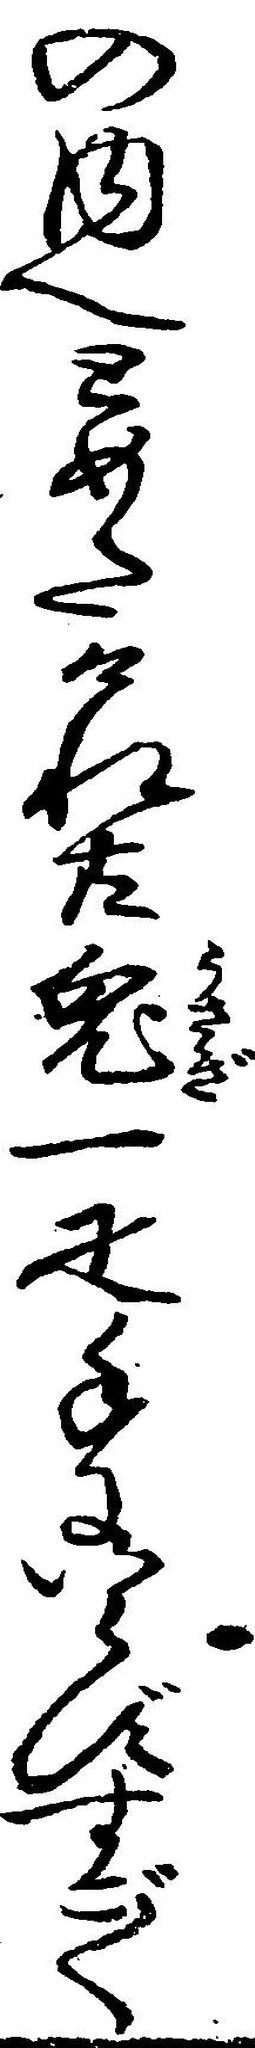の内へとめたけれ共兎一匹手にはいらずすご〳〵
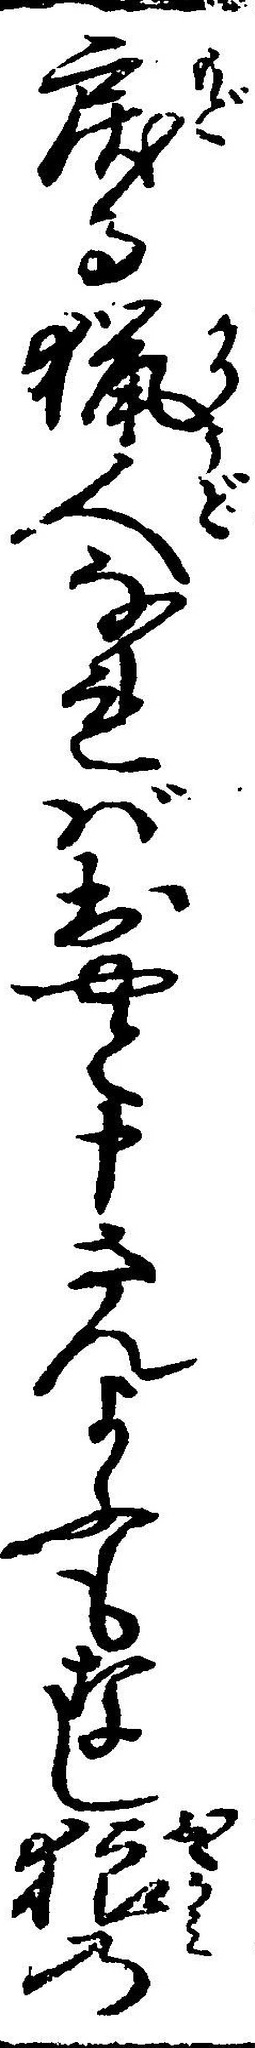戻る猟人なればおやと申さんよふもなし狼の
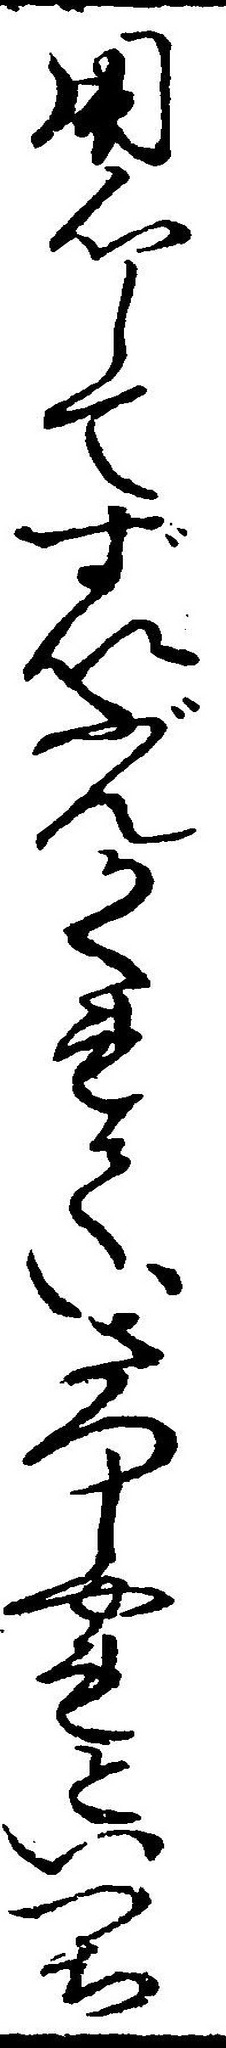用心してずいぶんかくれていさつしやれといつち
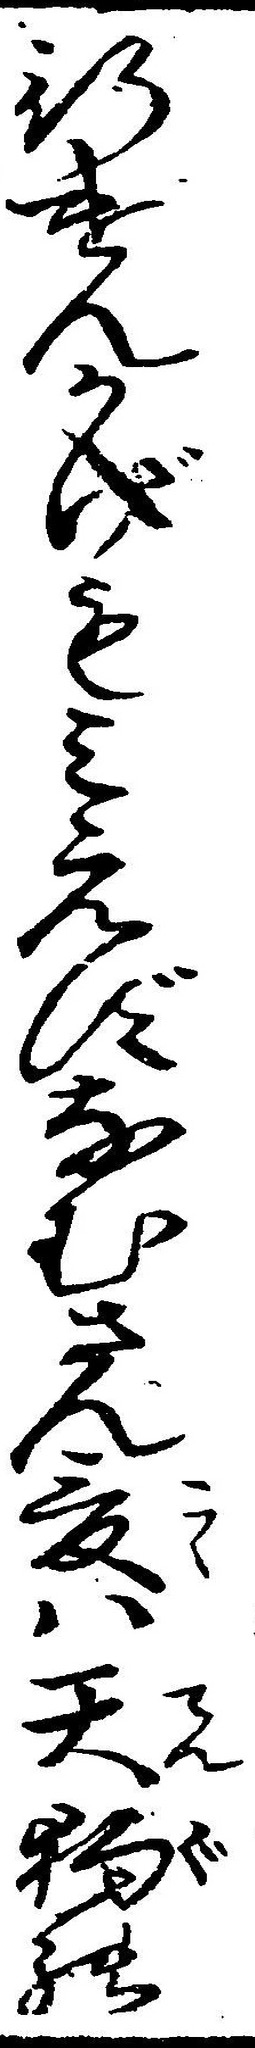行けんかげもみへずなむさん爰は天狗の
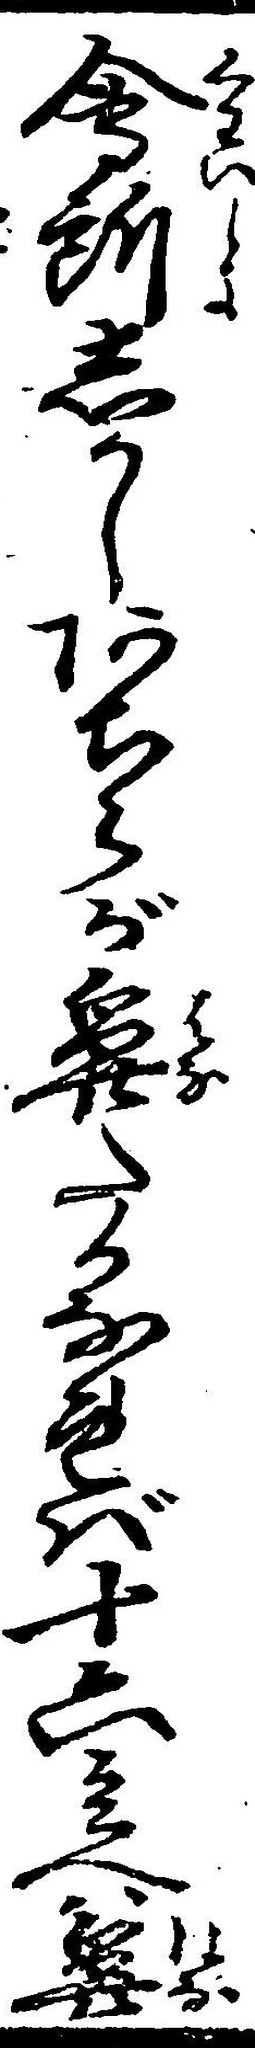会所しかしあちらが鼻たかなれば十六兵衛は鼻
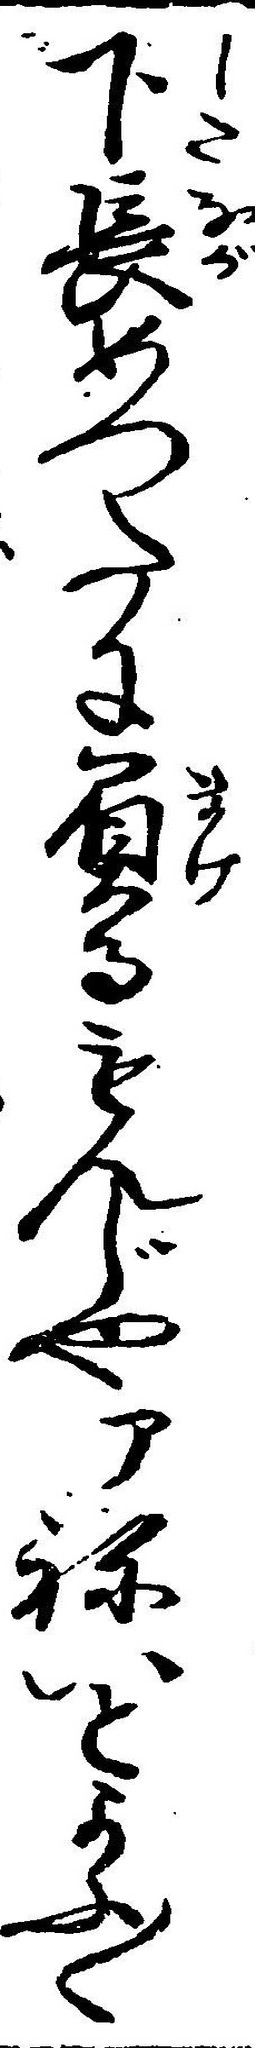下長めつたに負るもんじやァねいとよふ〳〵
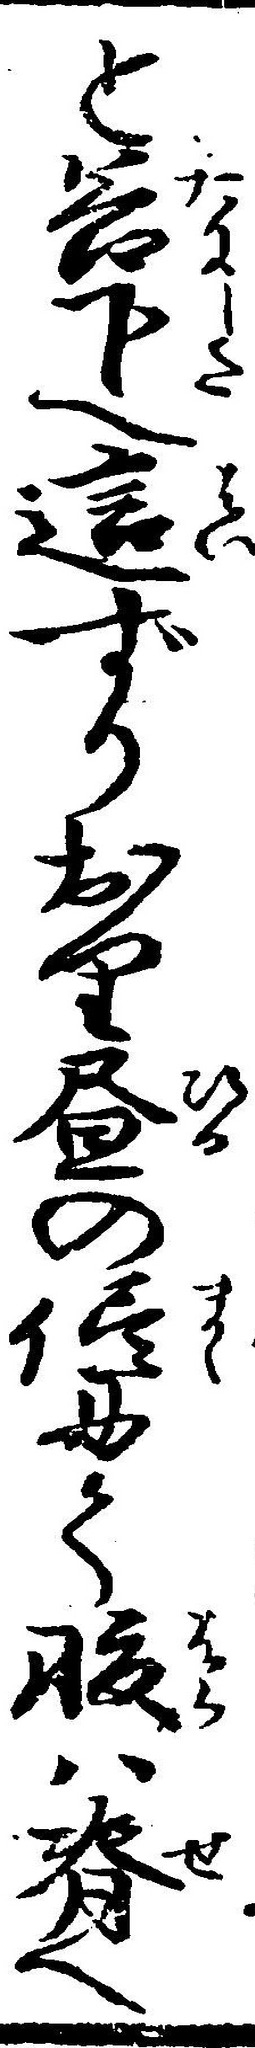と谷下へ這ずりおり昼の侭にて腹は背へ
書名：草木芝居化物退治 / 泉花堂三蝶(十六兵衛)作
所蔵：東京大学総合図書館 General Library in the University of Tokyo, JAPAN
